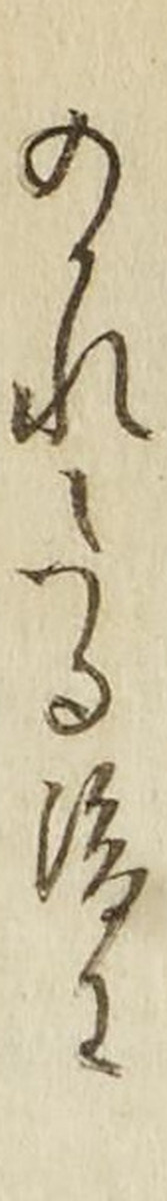のかれたる後に
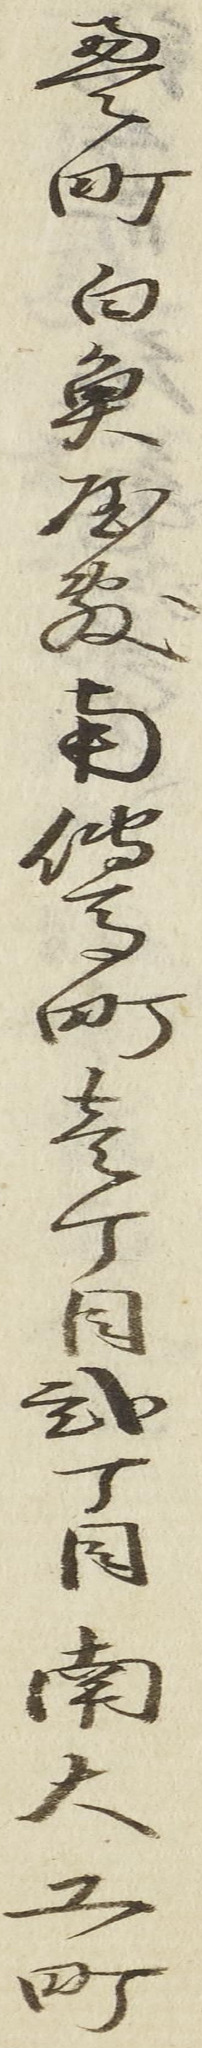畳町白魚屋敷南伝馬町壱丁目弐丁目南大工町
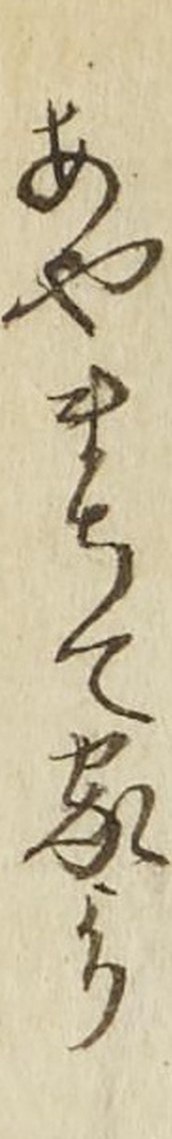あやまちて家より
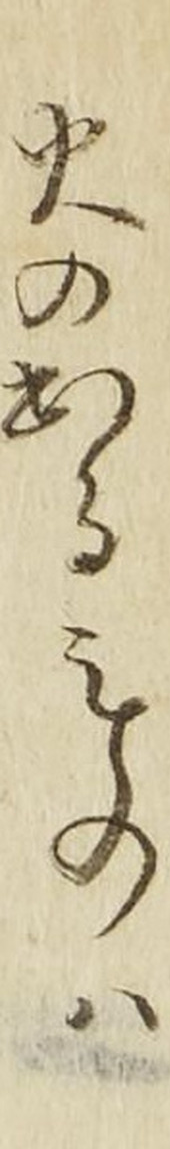火の出るものは
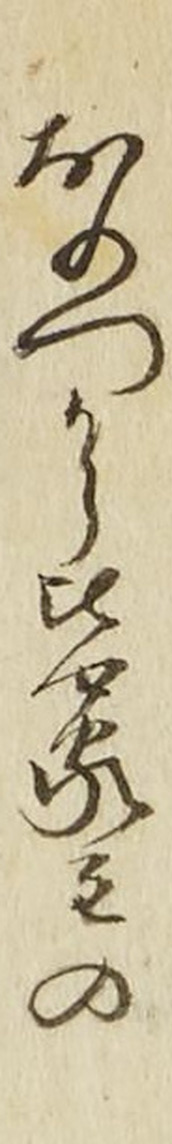おのつから皆家主の
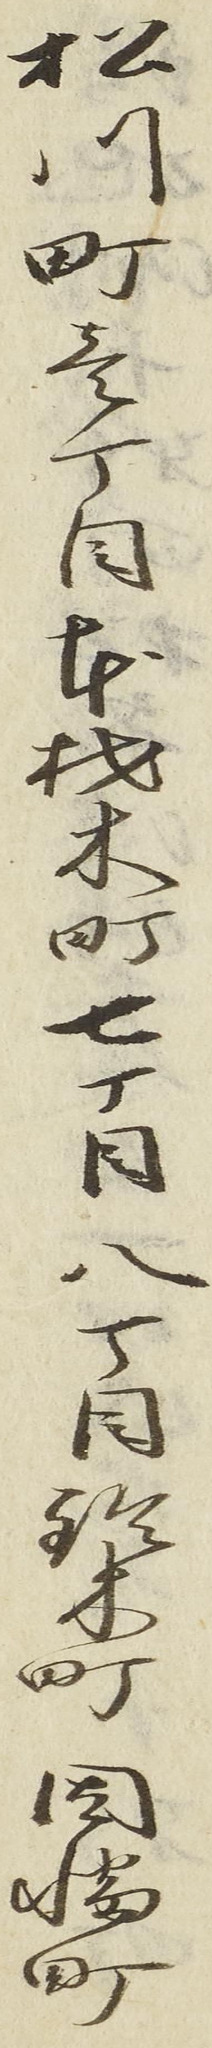松川町壱丁目本材木町七丁目八丁目鈴木町因幡町
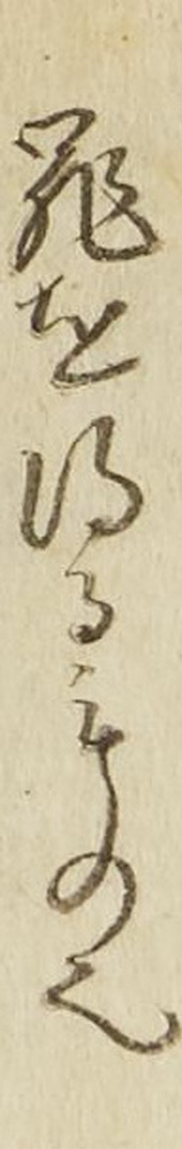罪を得るもの也
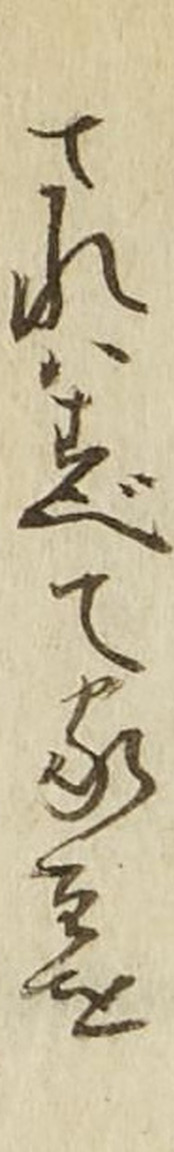されはすべて家主を
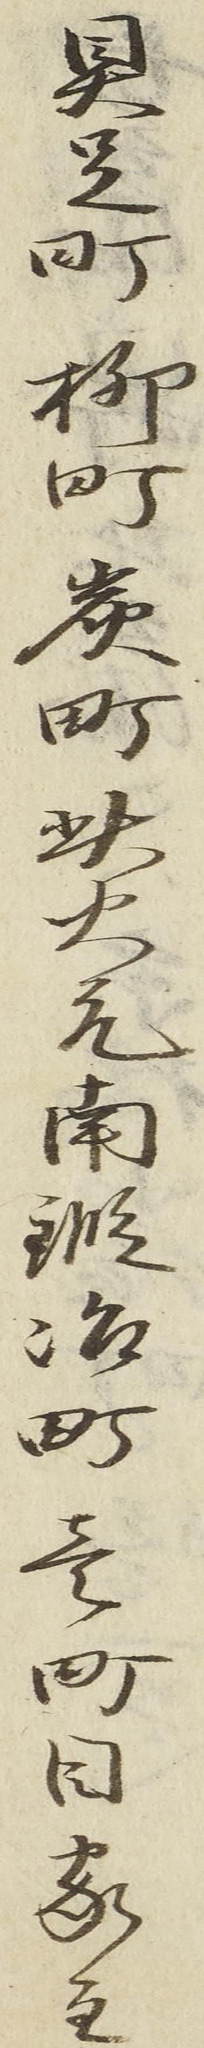具足町柳町炭町此火元南鍛冶町壱丁目家主
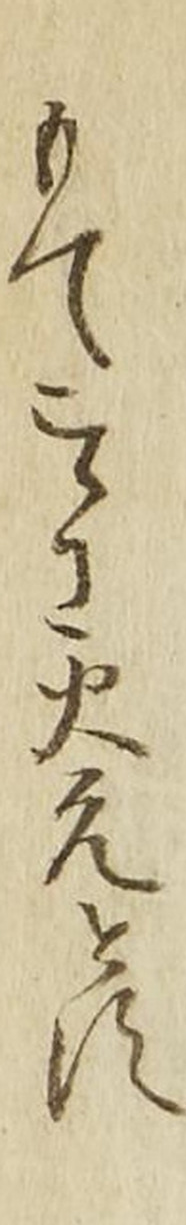もてこゝに火元とす

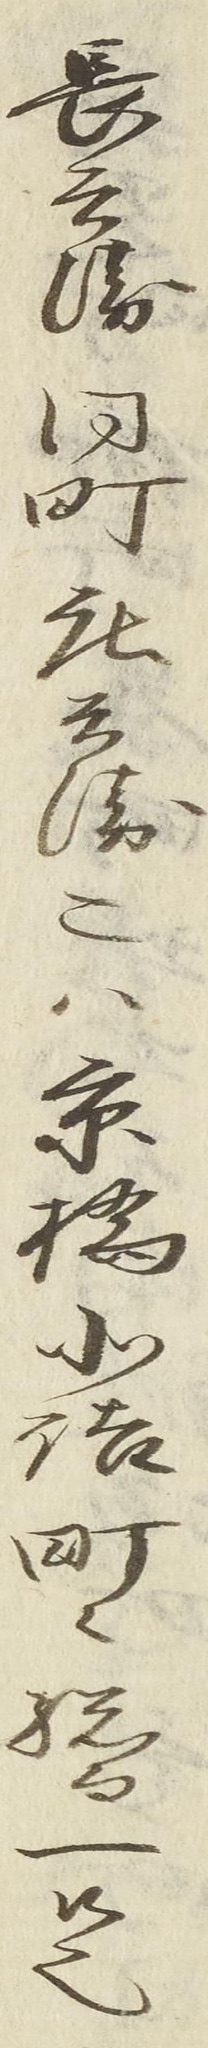長兵衛同町庄兵衛こは京橋北詰町〻総て一口也
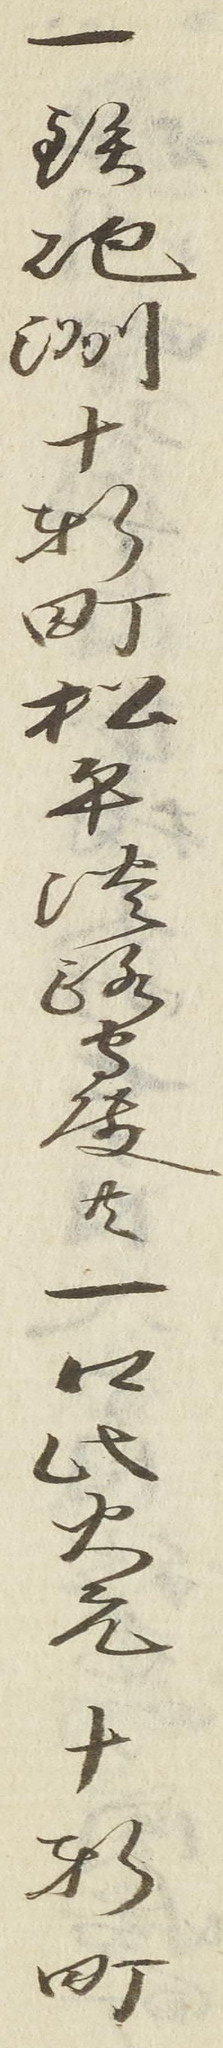一鉄砲洲十軒町松平淡路守殿共一口此火元十軒町
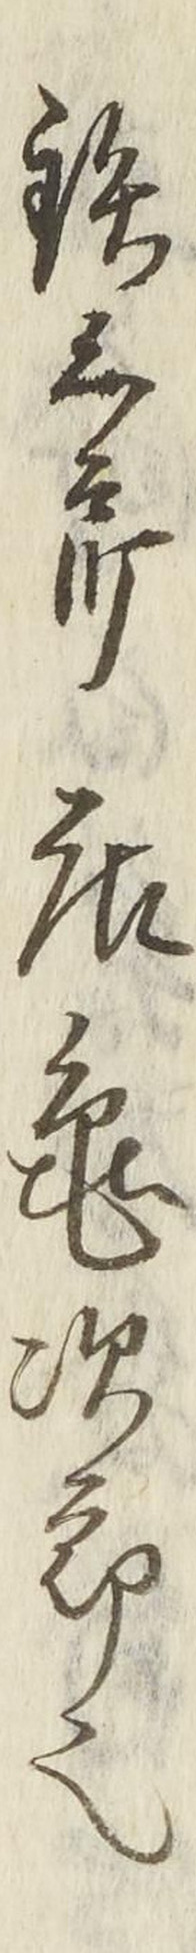鉄三郎店亀次郎也
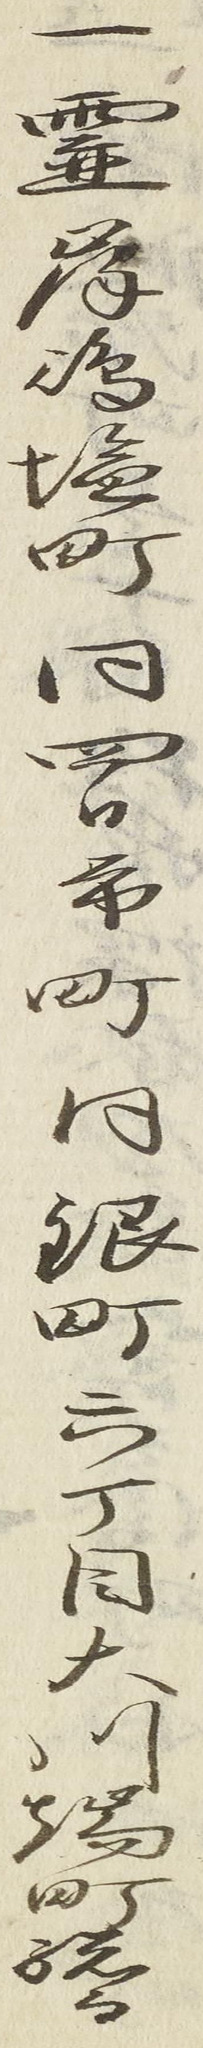一霊岸島塩町同四日市町同銀町六丁目大川端町総て
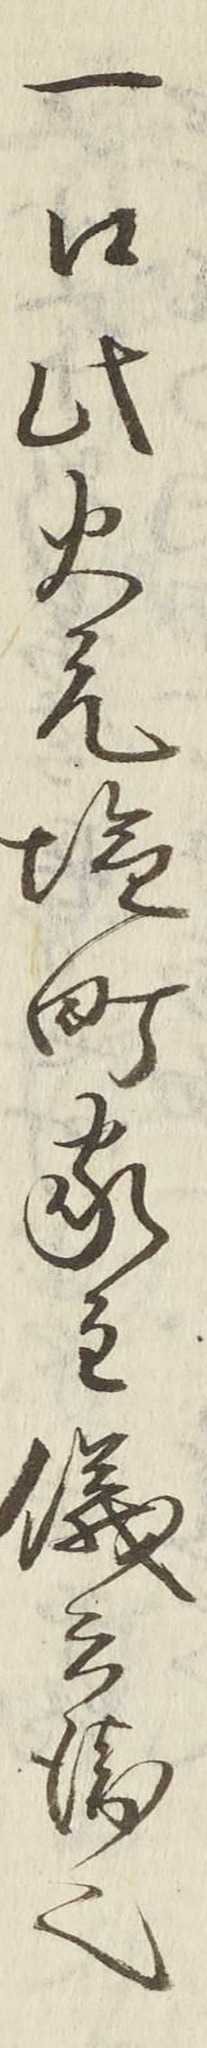一口此火元塩町家主儀兵衛也
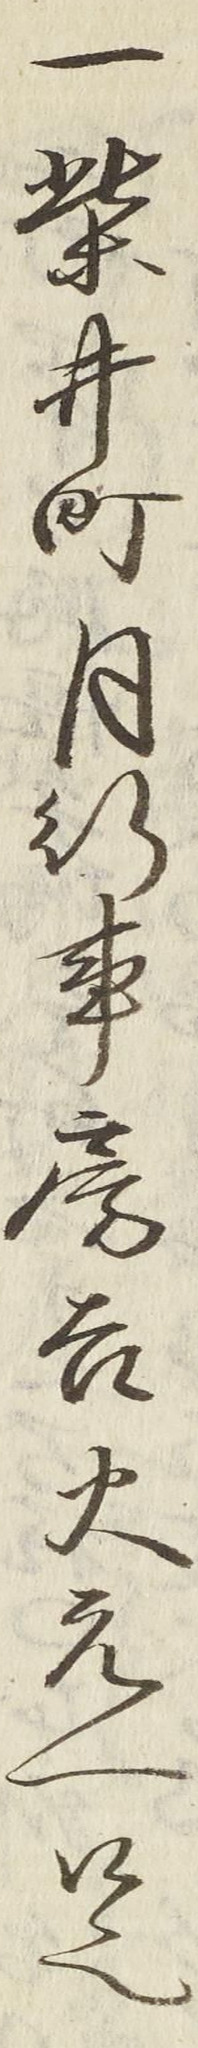一柴井町月行事房吉火元一口也
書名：やぶれ窓の記　全
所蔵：東京大学地震研究所図書室 Earthquake Research Institute Library, The University of Tokyo, JAPAN
